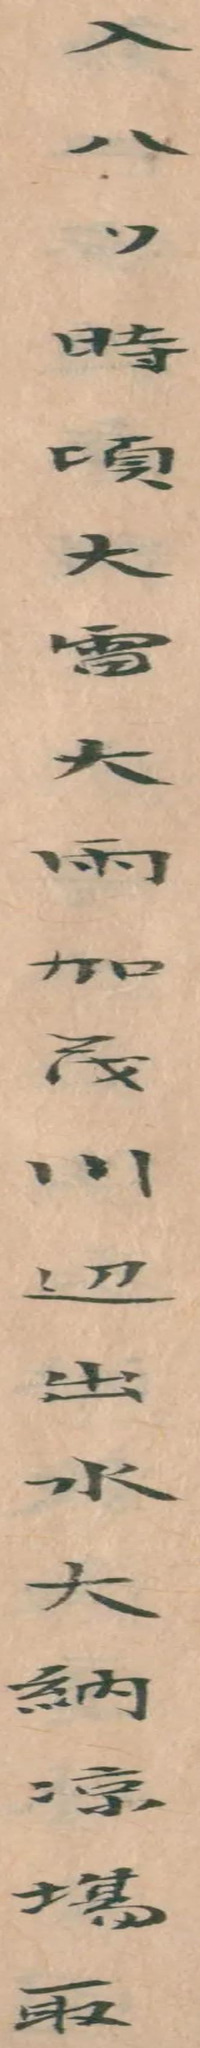入八ッ時頃大雷大雨加茂川辺出水大納涼場取
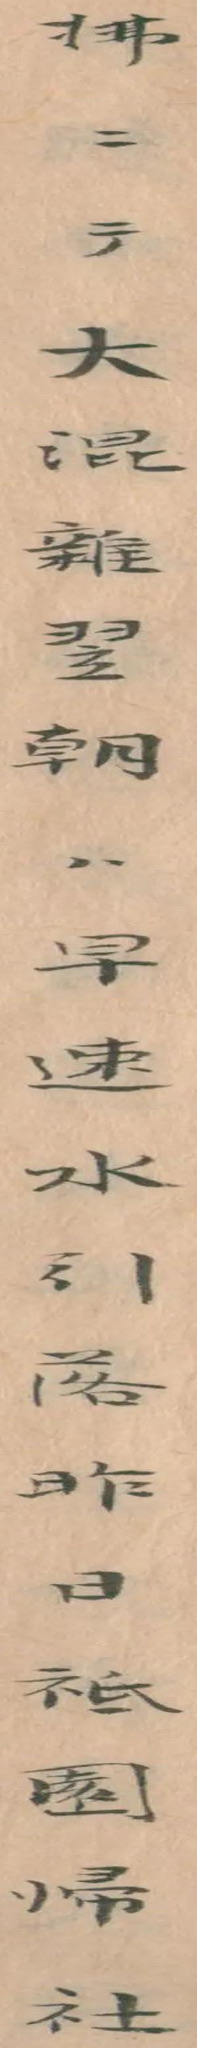払ニテ大混雑翌朝ハ早速水引落昨日祇園帰社

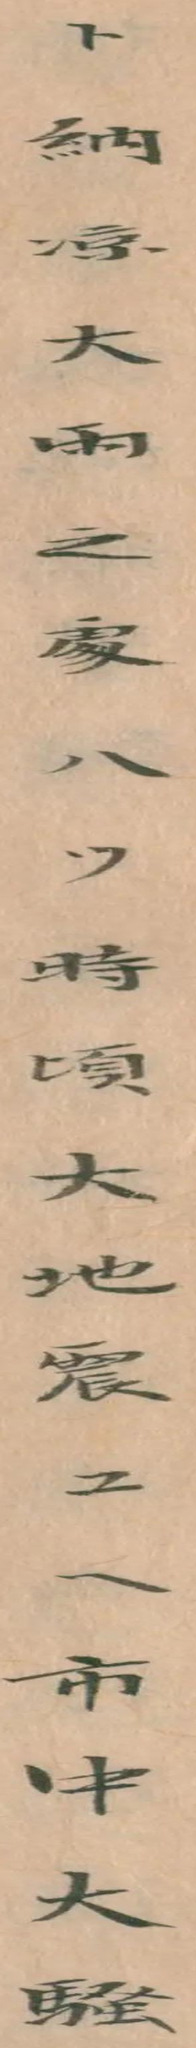ト納涼大雨之処八ッ時頃大地震ユヘ市中大騒
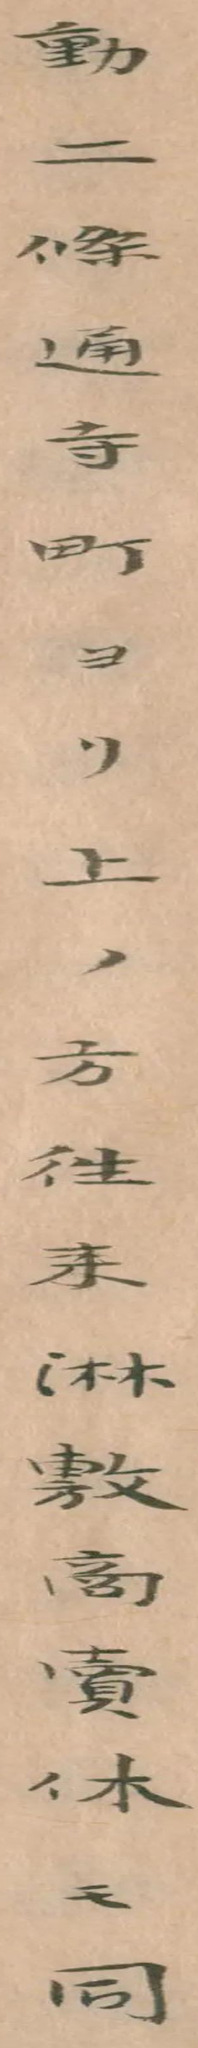動二條通寺町ヨリ上ノ方往来淋敷商売休モ同
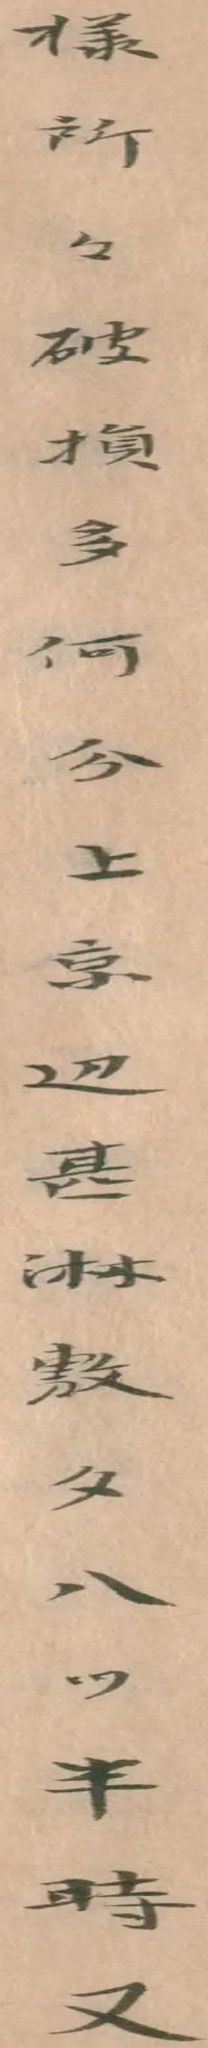様所々破損多何分上京辺甚淋敷夕八ッ半時又
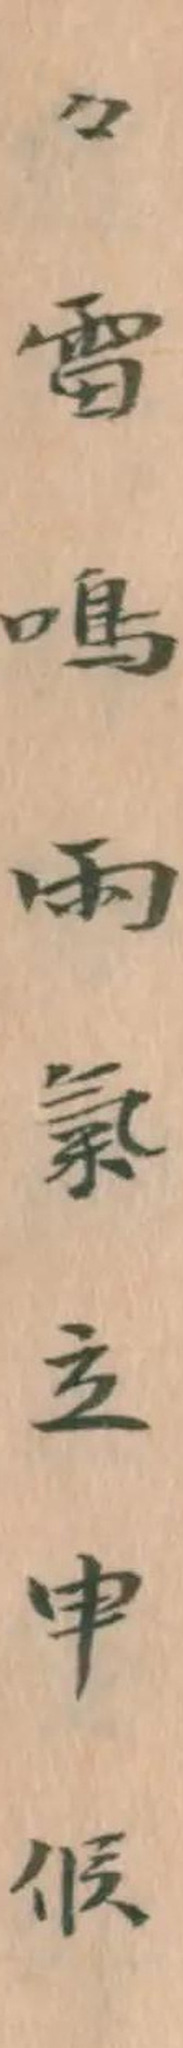々雷鳴雨気立申候
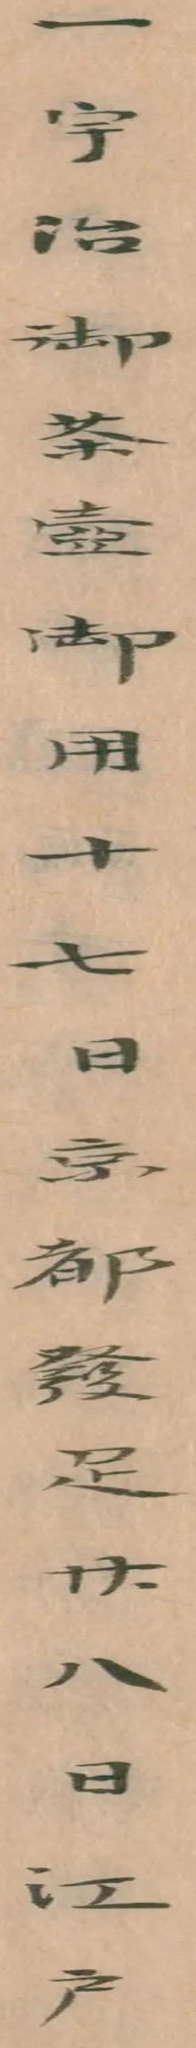一宇治御茶壺御用十七日京都発足廿八日江戸
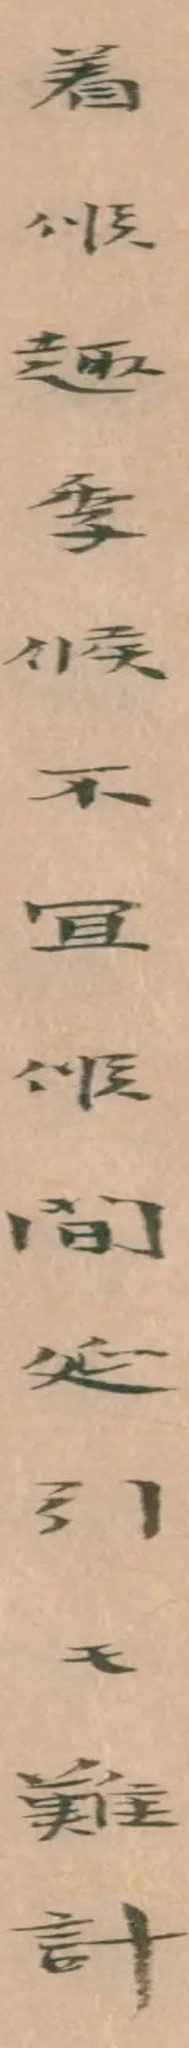着候趣気候不宜候間延引モ難計
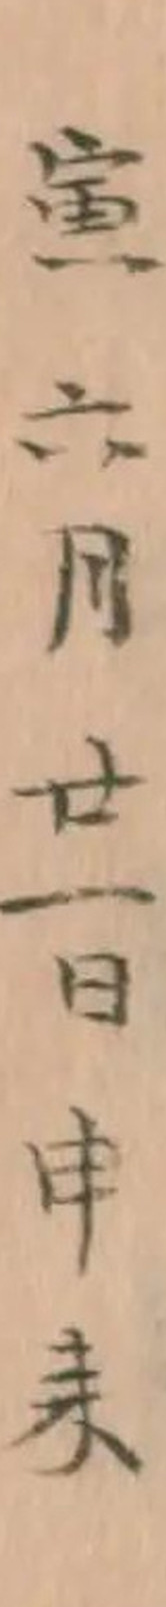寅六月廿一日申未
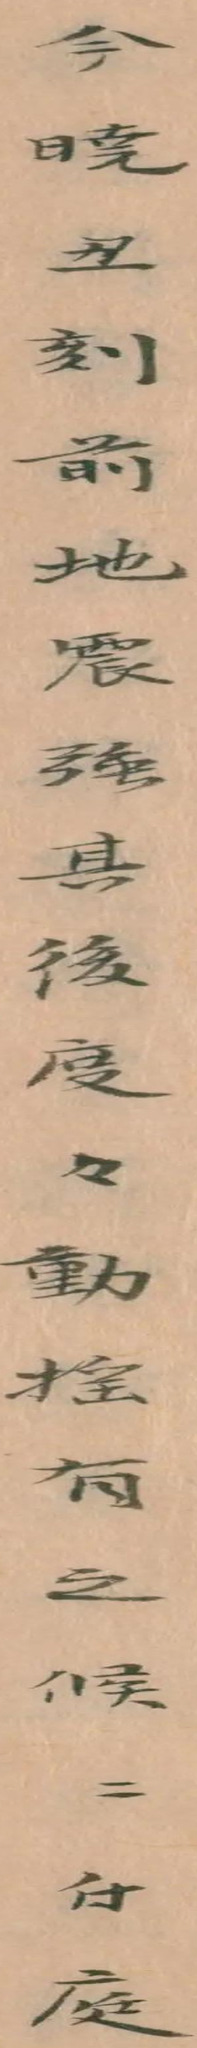今晩丑刻全地震強其後度々動揺有之候二付庭
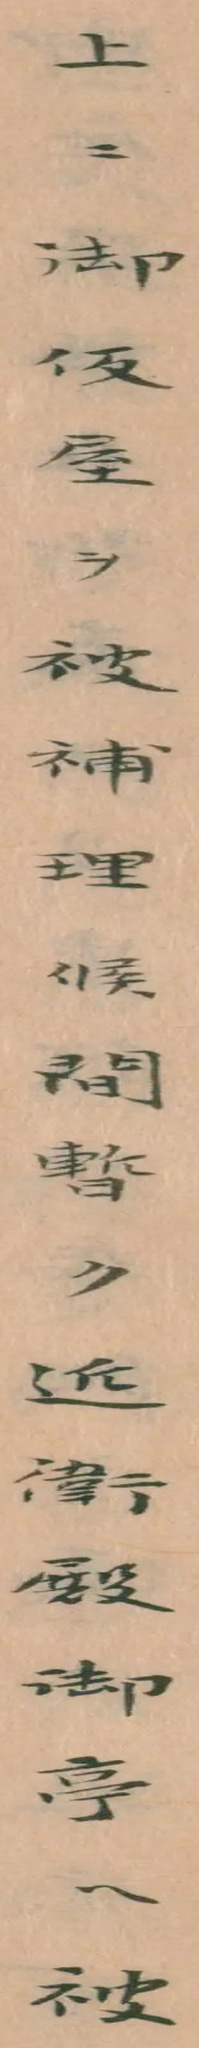上二御仮屋ヲ被補理候間暫ク近衛殿御亭へ被
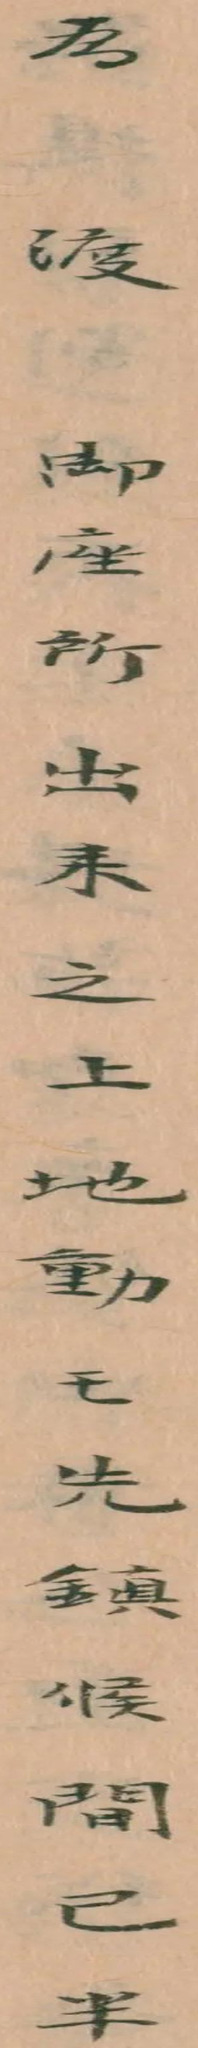為渡御座所出来之上地動モ先鎮候間巳半
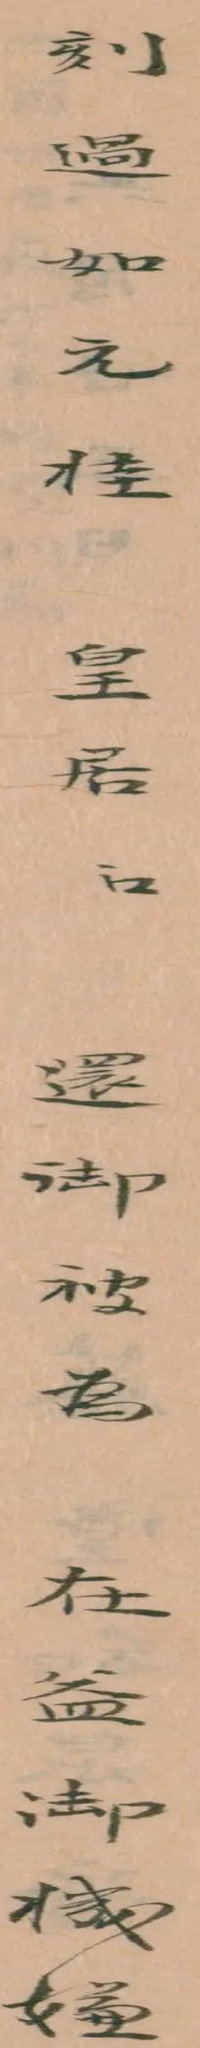刻過如元桂皇居江還御被為在益御機嫌
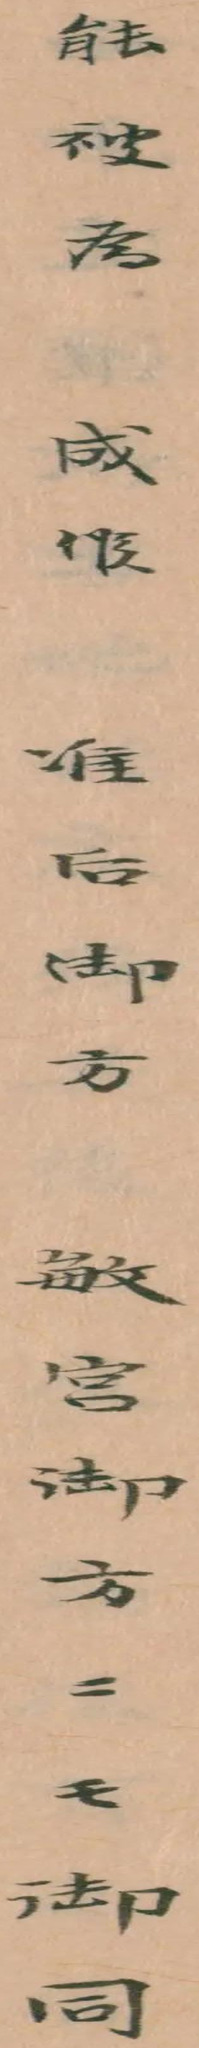能被為成候准后御方敏宮御方ニモ御同
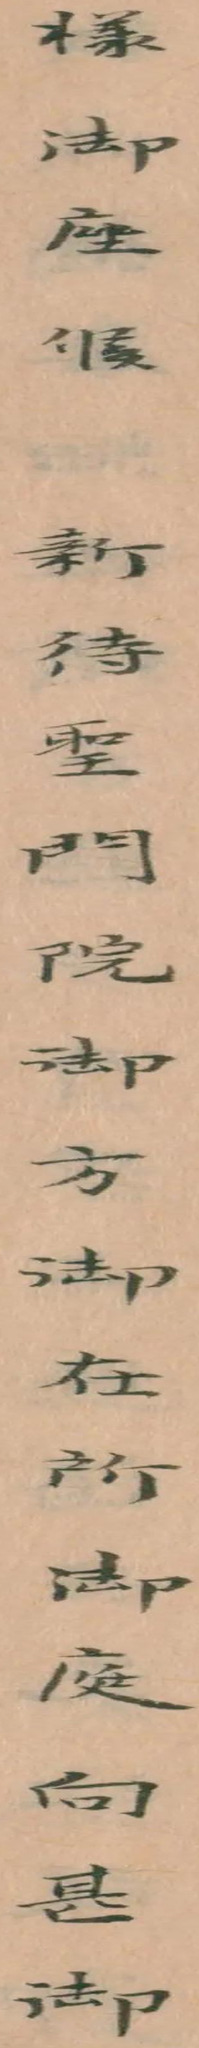様御座候新待聖門院御方御在所御庭向甚御
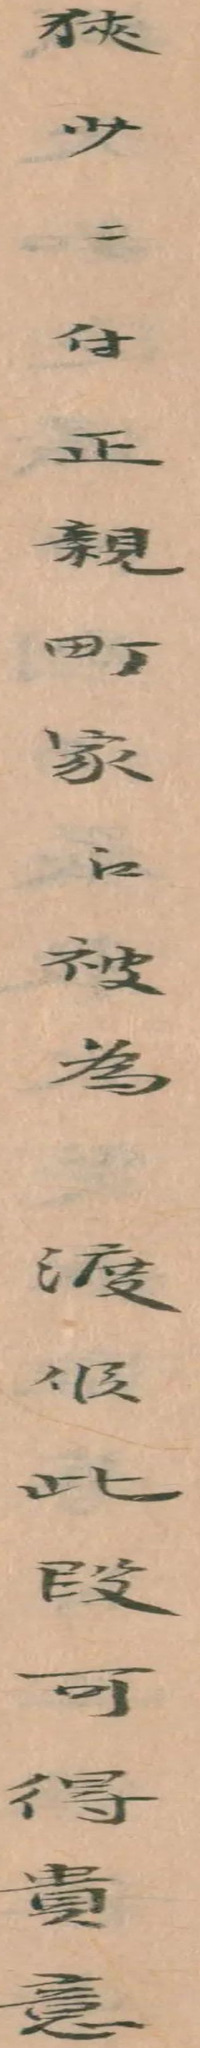狭少二付正親町家江被為渡候此段可得貴意
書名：地災撮要. 巻1(噴火山・地震ノ部)
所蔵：国立国会図書館 National Diet Library, JAPAN
